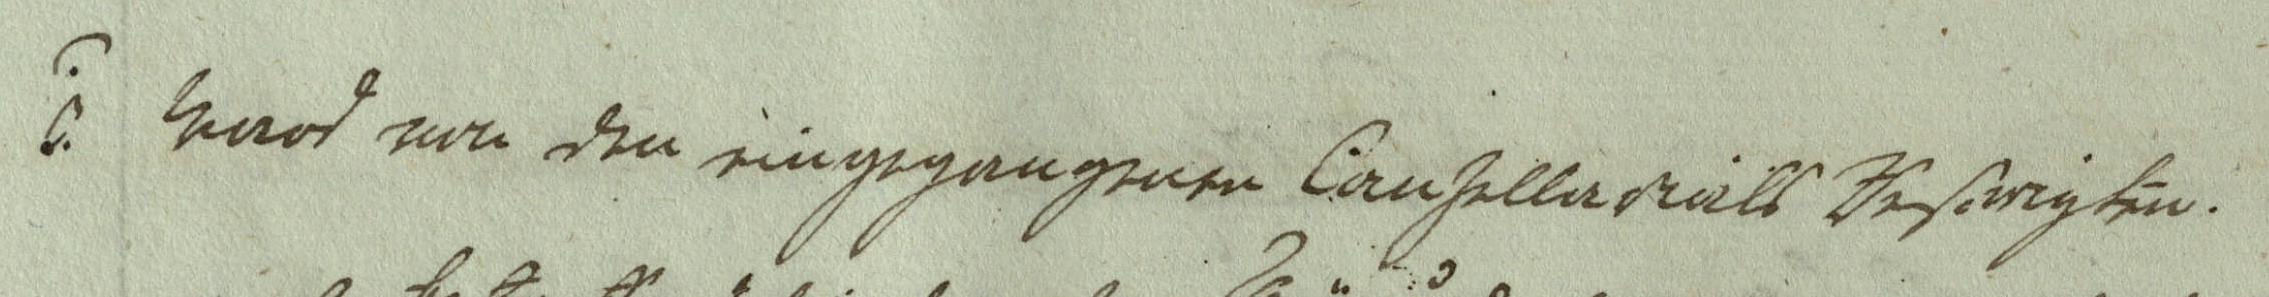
3. Ward von den eingegangenen Canzellariats Rescripten.
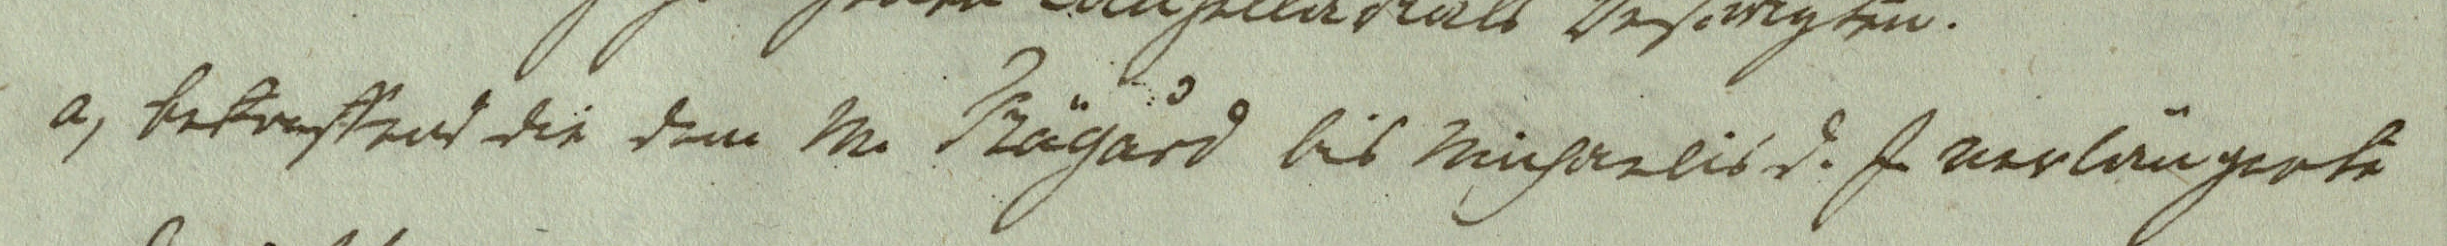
a, betreffend die dem M. Trägård bis Michaelis d. J. verlängerte
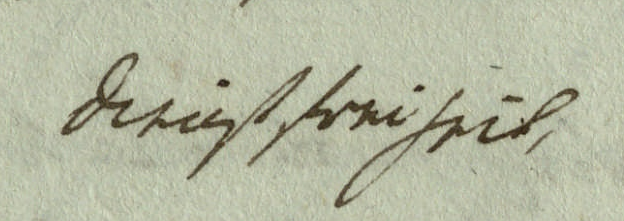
Dienstfreiheit,
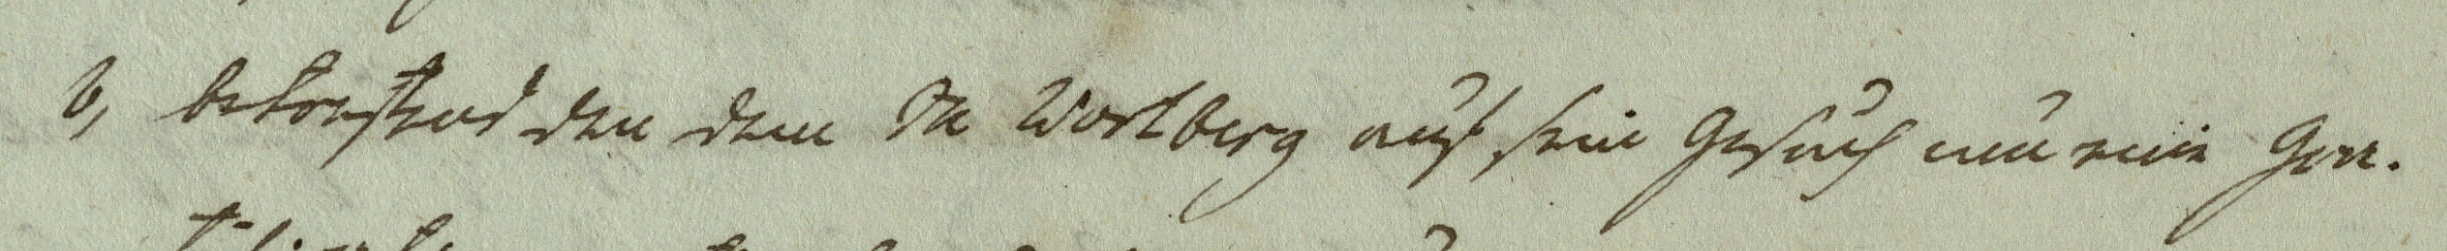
b, betreffend den dem M. Wortberg auf sein Gesuch um eine Gra¬
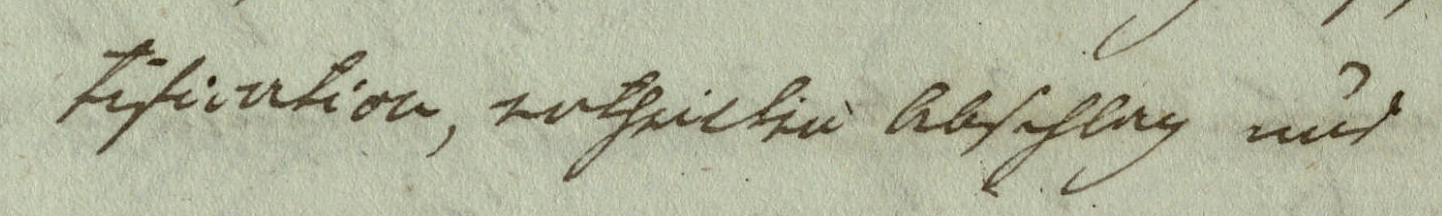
tification, ertheilten Abschlag und
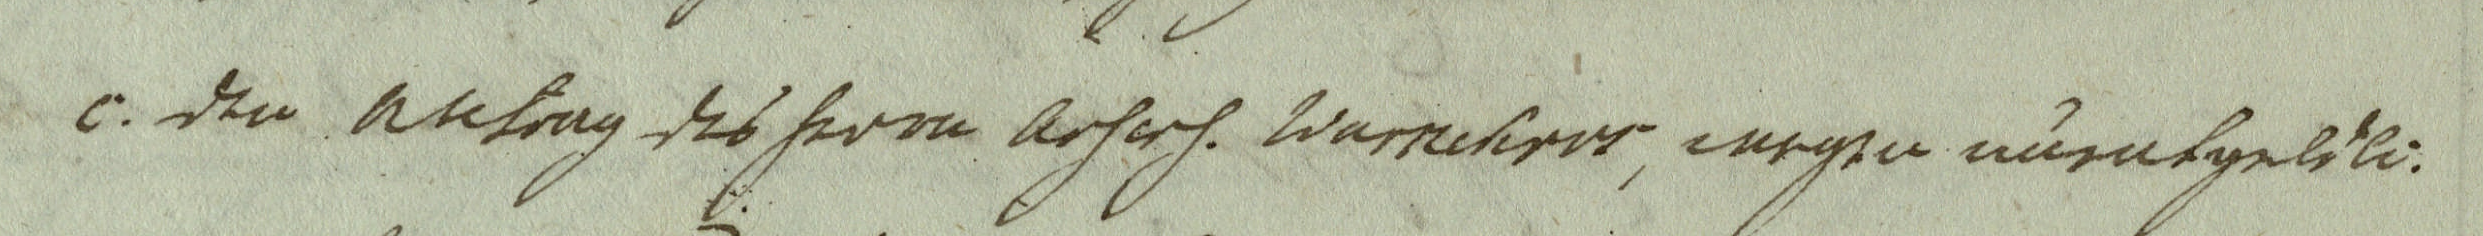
c, den Antrag des herrn Assess. Warnekros, wegen unentgeldli¬
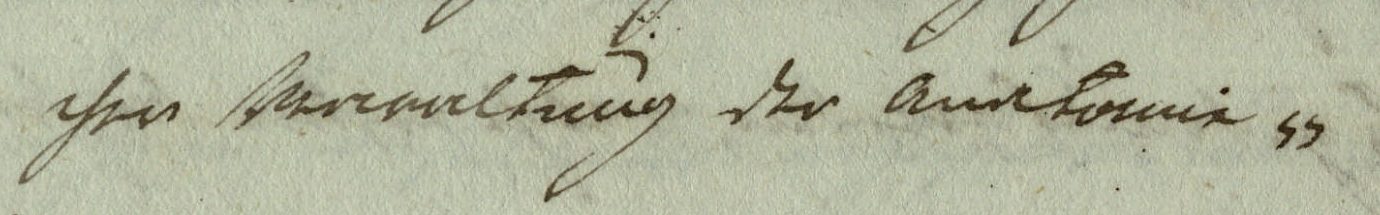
cher Verwaltung der Anatomie»
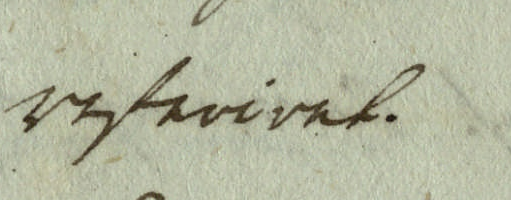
referiret.
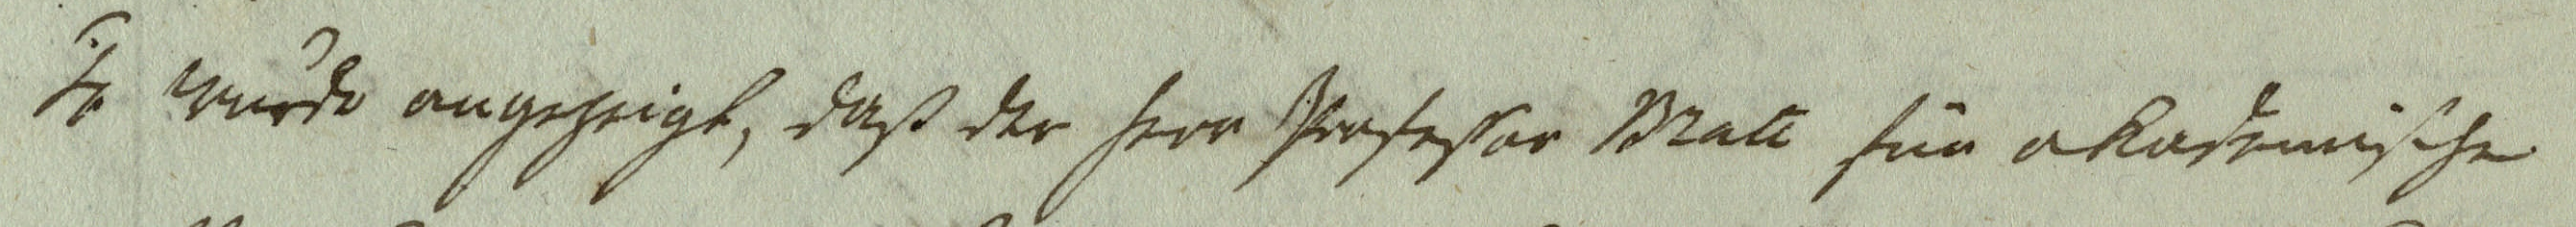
4. Wurde angezeigt, daß der herr Professor Bratt für akademische
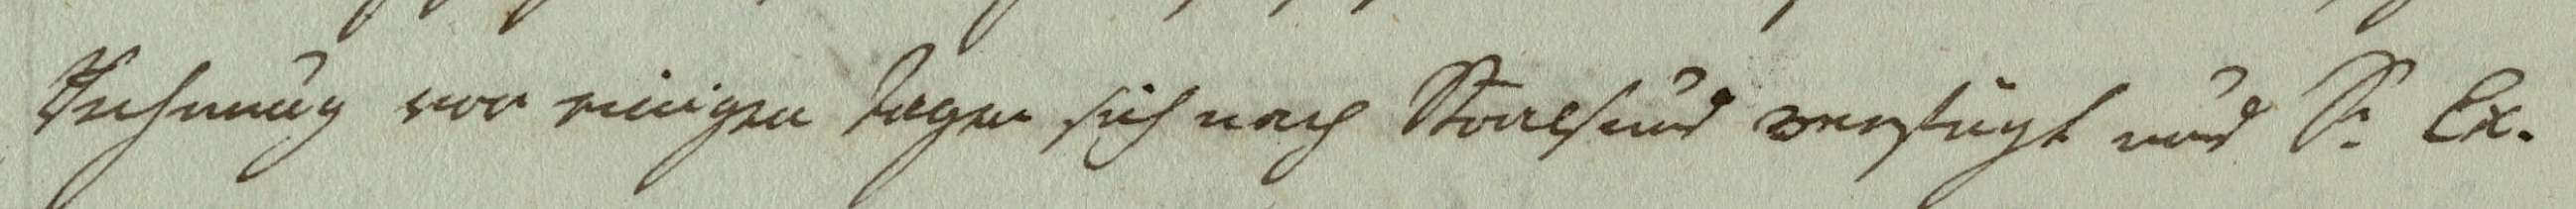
Rechnung vor einigen Tagen sich nach Stralsund verfügt und Sr. Ex¬
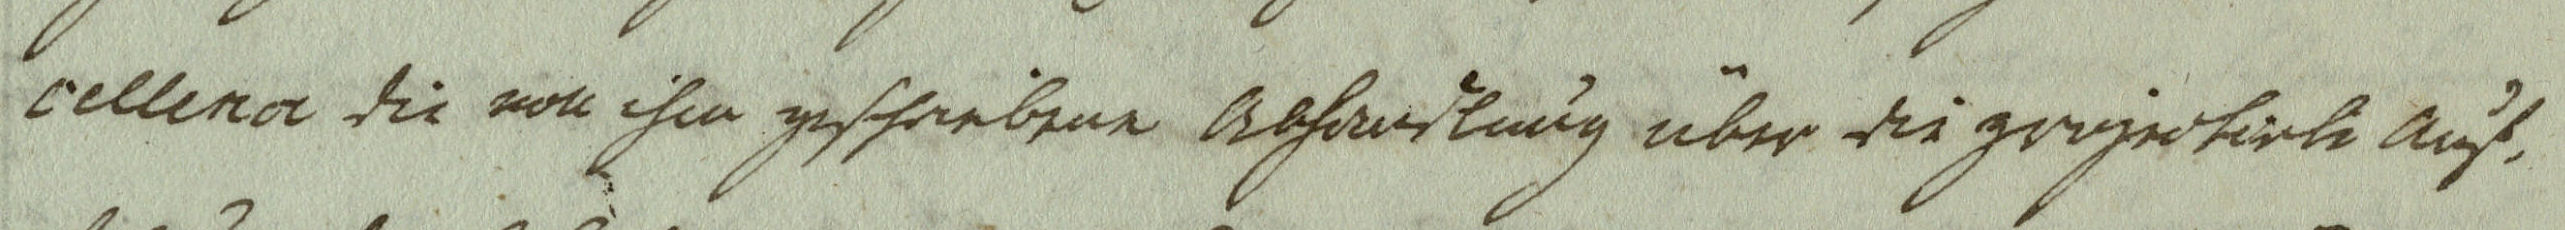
cellence die von ihm geschriebene Abhandlung über die projectirte Auf¬
